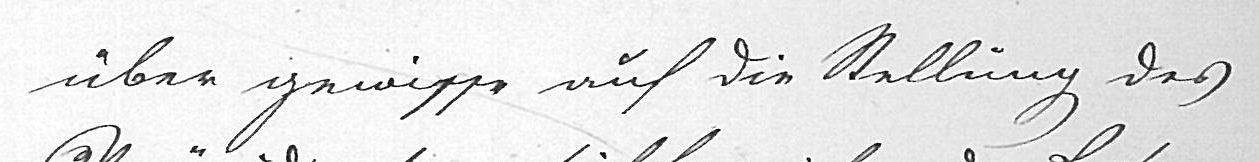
über gewisse auf die Stellung des
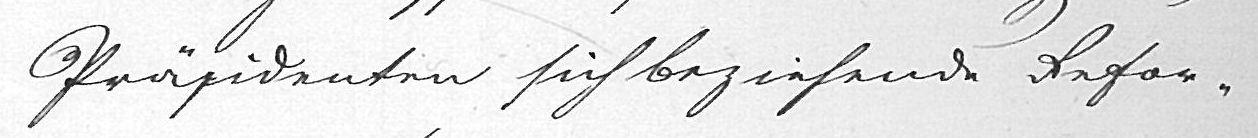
Präsidenten sich beziehende Refor-
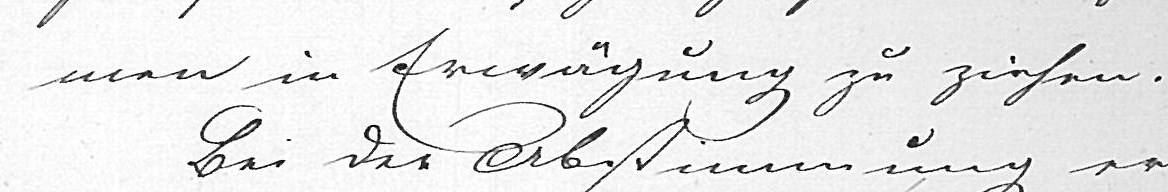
men in Erwägung zu ziehen.
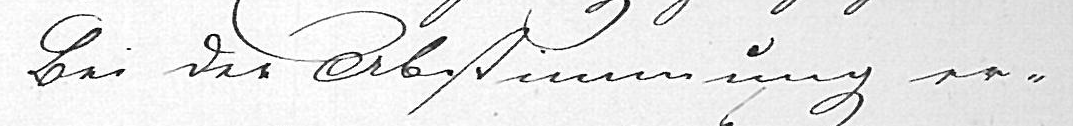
Bei der Abstimmung er-
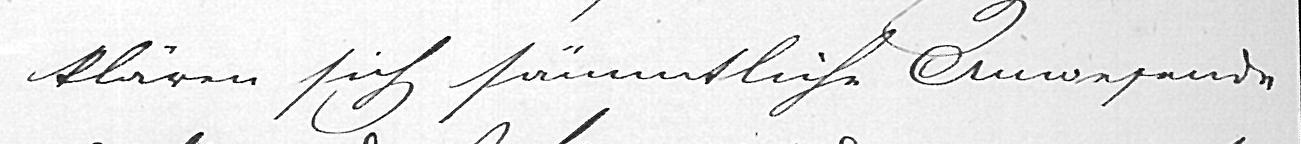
klaren sich sämmtliche Anwesende
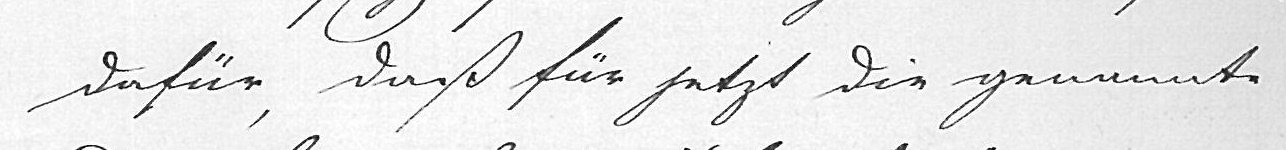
dafür, daß für jetzt die genannte
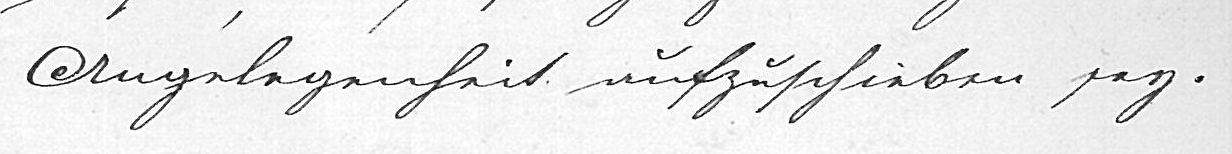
Angelegenheit aufzuschieben sey.
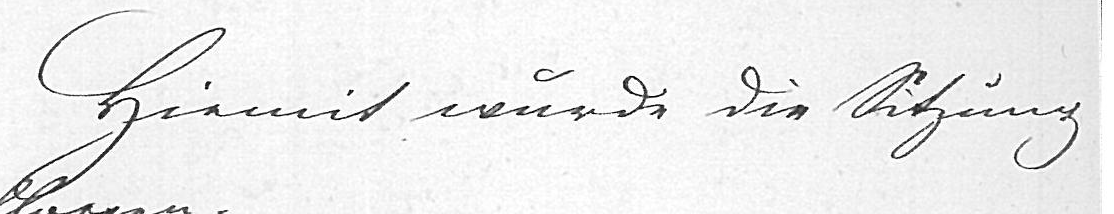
Hiemit wurde die Sitzung
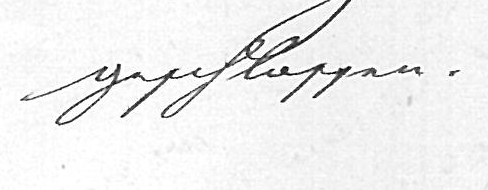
geschlossen.
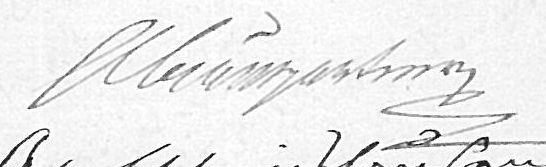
ABaumgartner
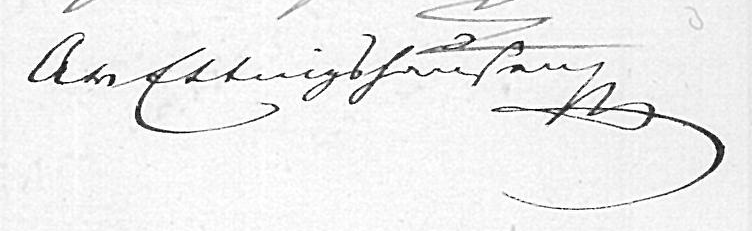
AvEttingshausen
